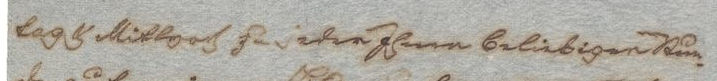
tag & Mitwoch jeder Ihnen beliebigen Stun-
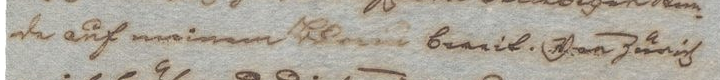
de auf meinem Bureau bereit. Von Zürich
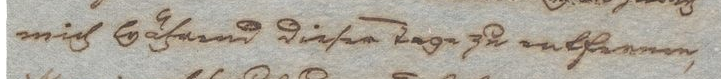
mich während dieser Tage zu entfernen,
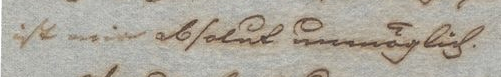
ist mir absolut unmöglich.
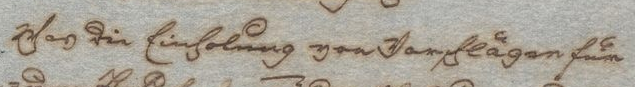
Was die Einholung von Vorschlägen für
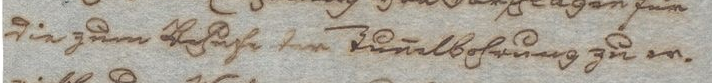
die zum Behufe der Tunnelbohrung zu er-
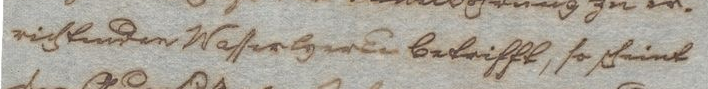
richtenden Wasserwerke betrifft, so scheint
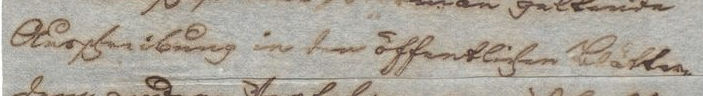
Ausschreibung in der öffentlichen Blättern
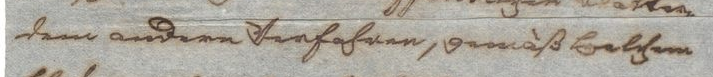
dem andern Verfahren, gemäß welchem
